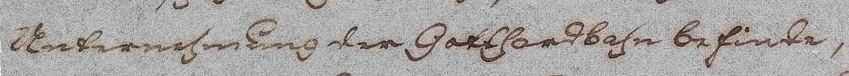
Unternehmung der Gotthardbahn befinde,
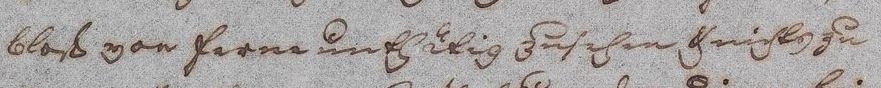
bloß von ferne unthätig zusehen & nichts zu
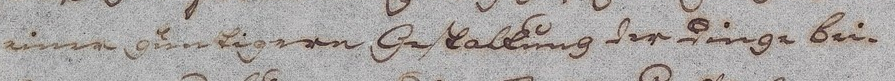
einer günstigern Gestaltung der Dinge bei-
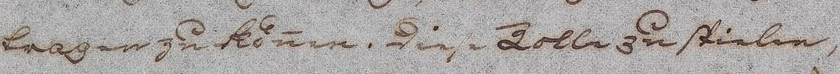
tragen zu können. Diese Rolle zu spielen,
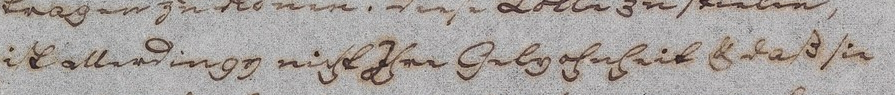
ist allerdings nicht Ihre Gewohnheit & daß sie
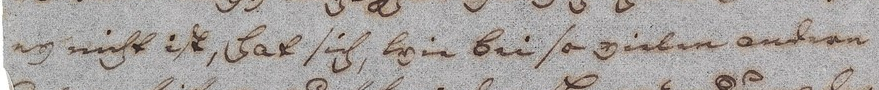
es nicht ist, hat sich, wie bei so vielen andern
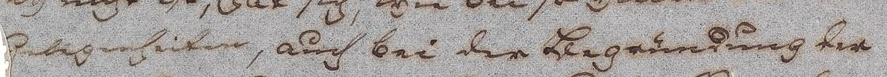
Gelegenheiten, auch bei der Begründung der
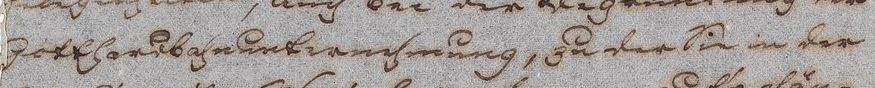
Gotthardbahnunternehmung, zu der Sie in der
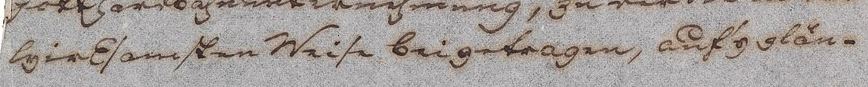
wirksamsten Weise beigetragen, auf's glän-
